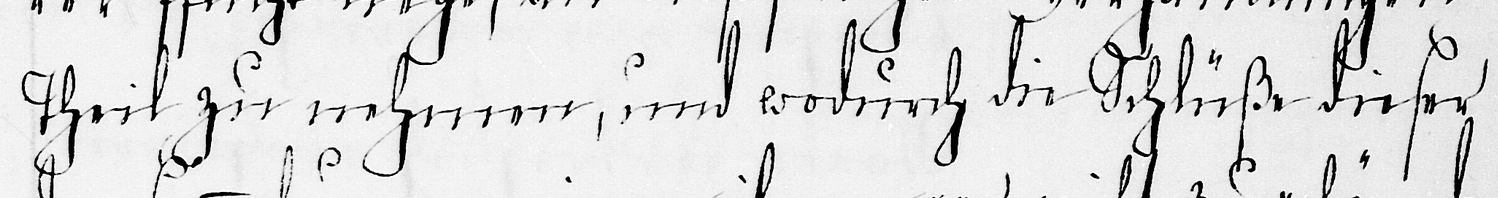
Theil zu nehmen, und wodurch die Schlüße dieser
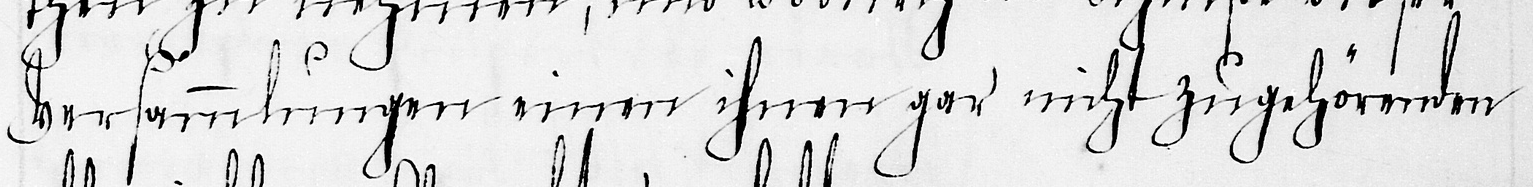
Versammlungen einen ihnen gar nicht zugehörenden
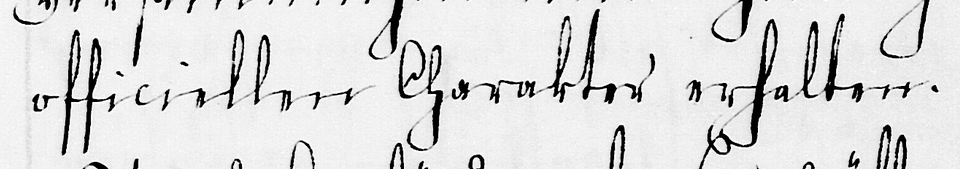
officiellen Charakter erhalten.
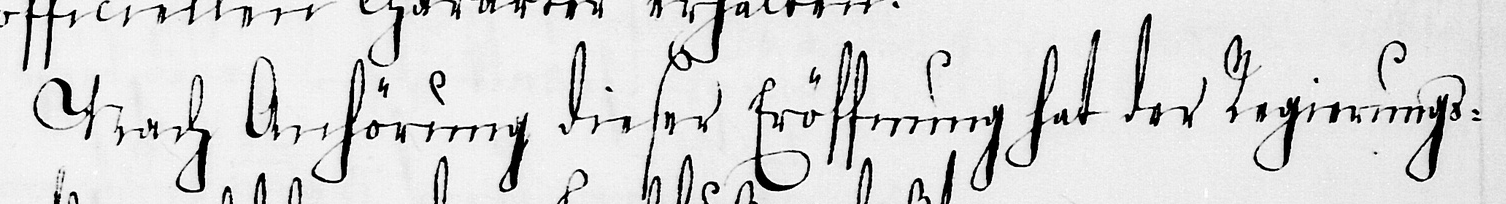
Nach Anhörung dieser Eröffnung hat der Regierungs¬
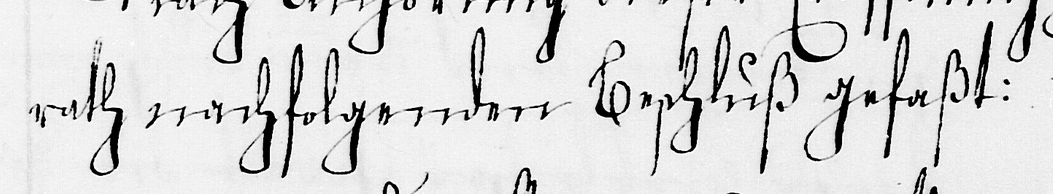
rath nachfolgenden Beschluß gefaßt:
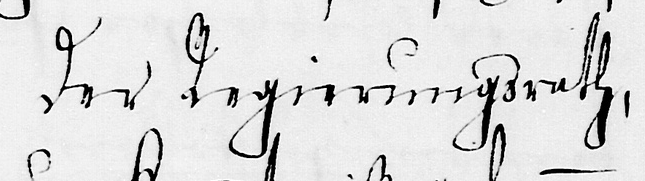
Der Regierungsrath,
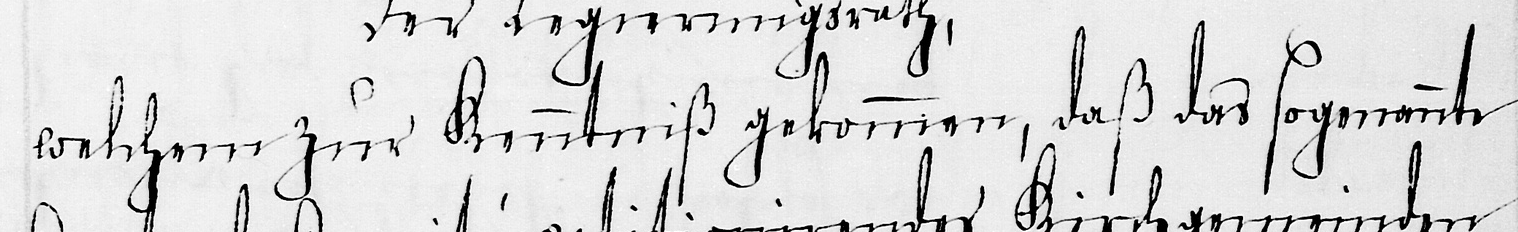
welchem zur Kenntniß gekommen, daß das sogenannte
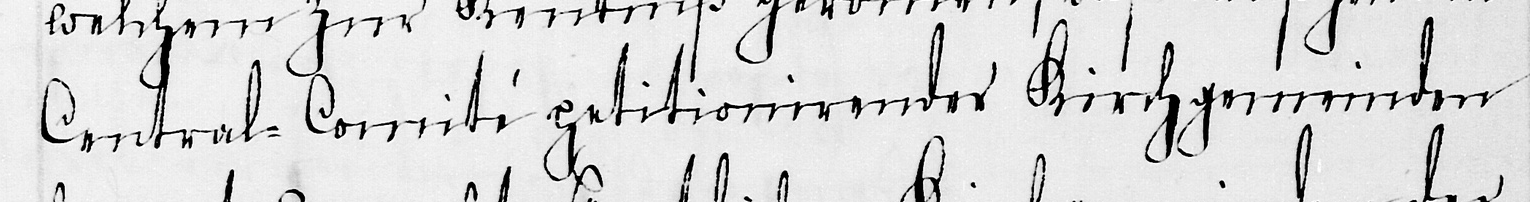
Central-Comité petitionirender Kirchgemeinden
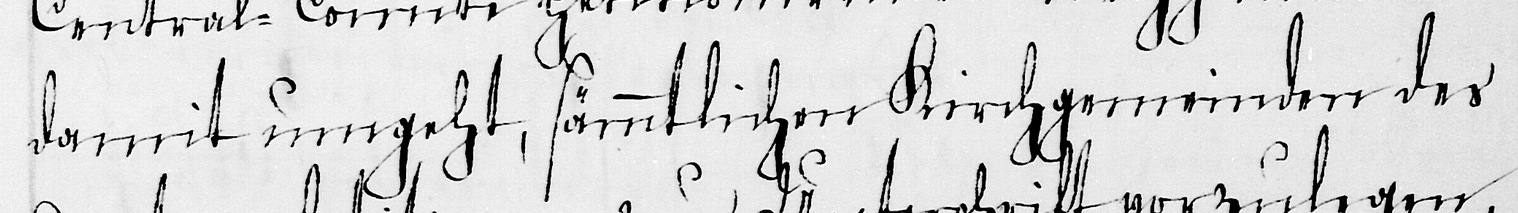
damit umgeht, sämmtlichen Kirchgemeinden des
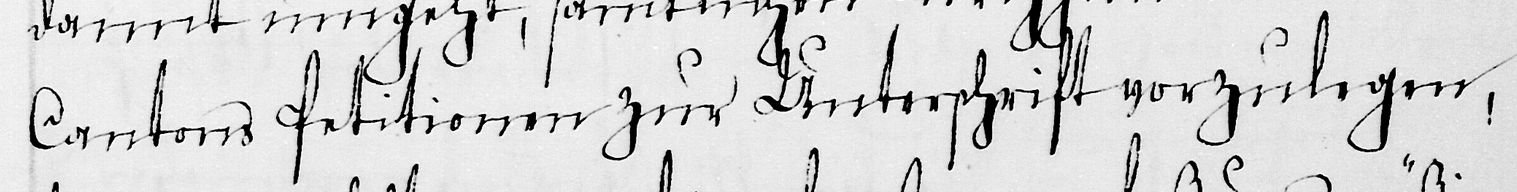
Cantons Petitionen zur Unterschrift vorzulegen,
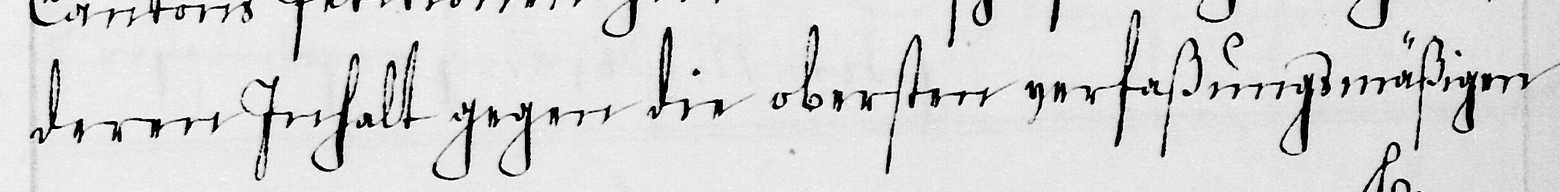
deren Inhalt gegen die obersten verfaßungsmäßigen
